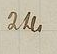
24.
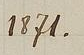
1871.
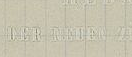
Hochgeachteter
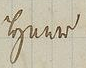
Herr und
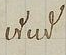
Freund,
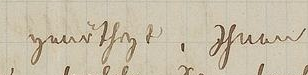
genöthigt, Ihnen
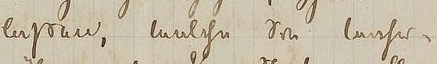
laßen, welche Sie wahr-
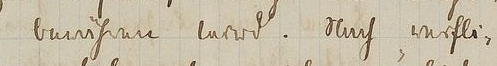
berühren wird. Nach reifli-
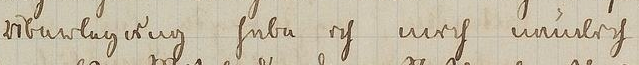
Überlegung habe ich mich nämlich
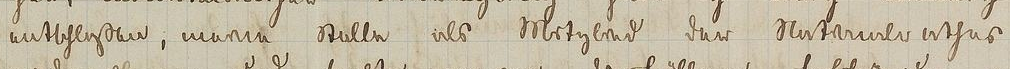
entschlossen, meine Stelle als Mitglied des Nationalrathes
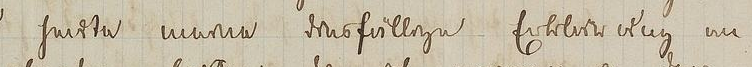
heute meine diesfällige Erklärung an
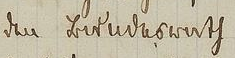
den Bundesrath
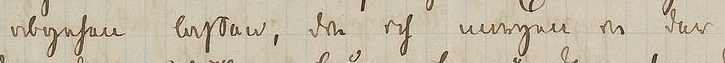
abgehen lassen, die ich morgen in der
